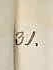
31.
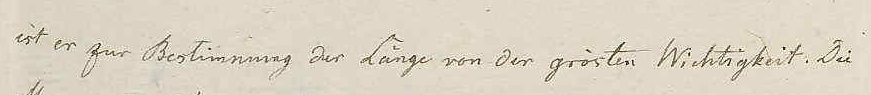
ist er zur Bestimmung der Länge von der grösten Wichtigkeit. Die
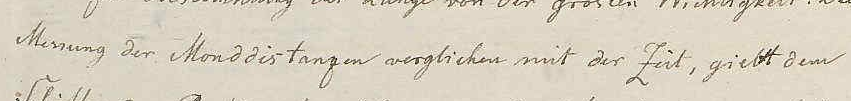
Messung der Monddistanzen verglichen mit der Zeit, giebt dem
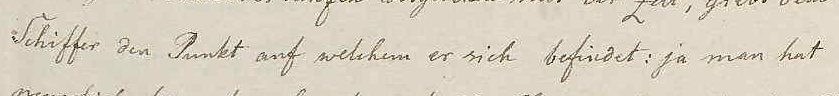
Schiffer den Punkt auf welchem er sich befindet: ja man hat
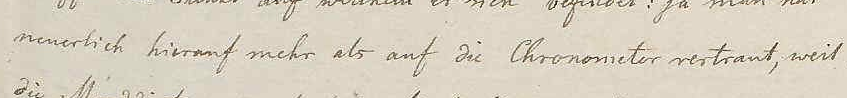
neuerlich hierauf mehr als auf die Chronometer vertraut, weil
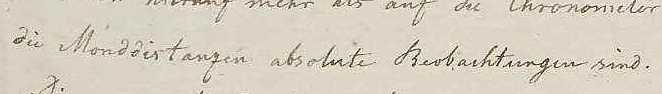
die Monddistanzen absolute Beobachtungen sind.
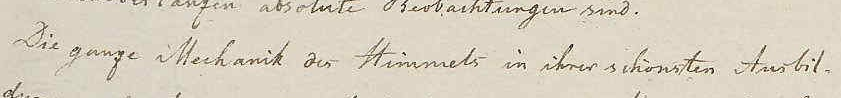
Die ganze Mechanik des Himmels in ihrer schönsten Ausbil-
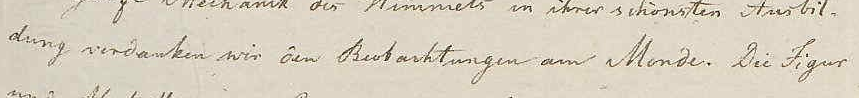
dung verdanken wir den Beobachtungen am Monde. Die Figur
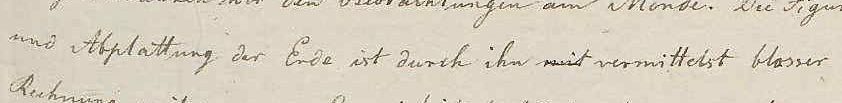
und Abplattung der Erde ist durch ihn mitvermittelst blosser
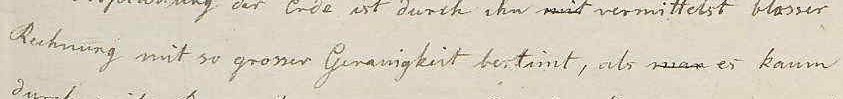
Rechnung mit so grosser Genauigkeit bestimt, als manes kaum
